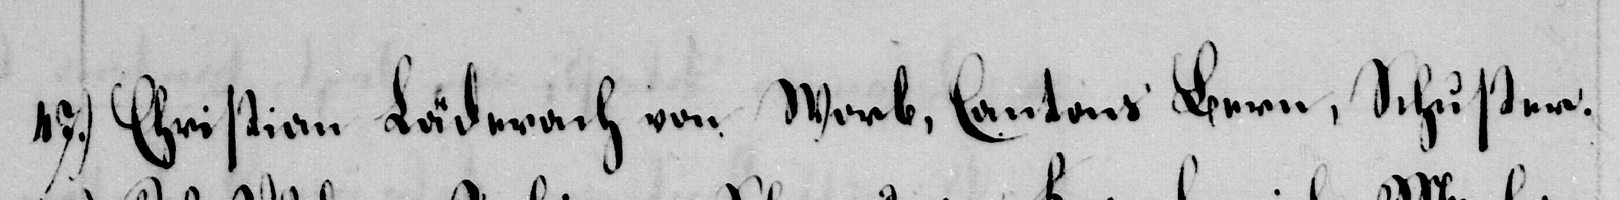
47.) Christian Läderach von Worb, Cantons Bern, Schuster.
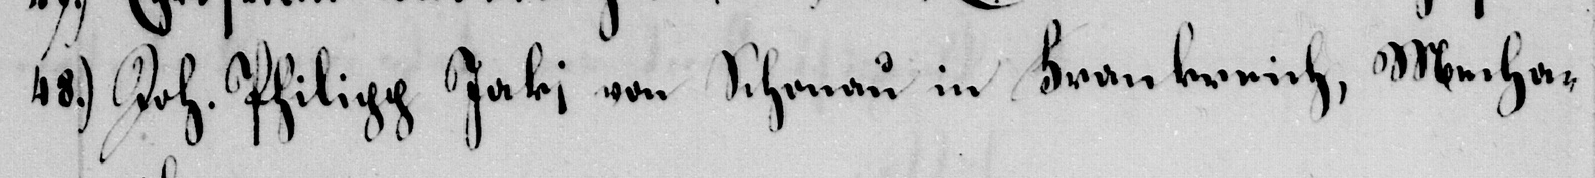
48.) Joh. Philipp Jaki von Schonau in Frankreich, Mechan¬
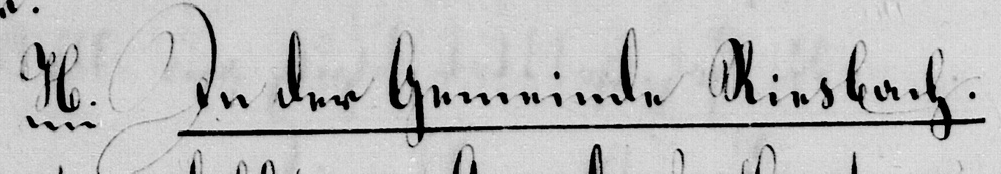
H. In der Gemeinde Riesbach.
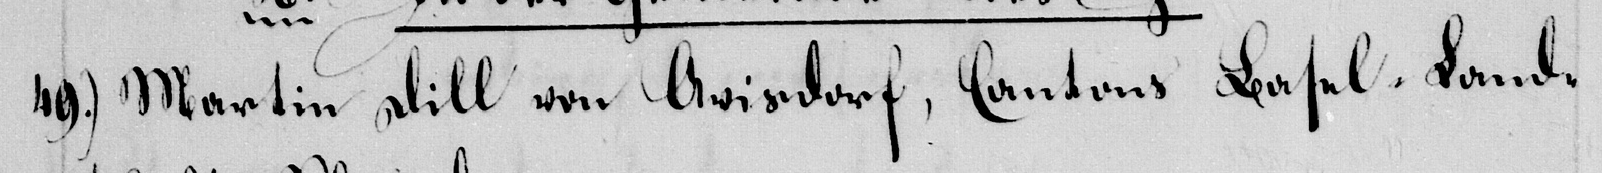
49.) Martin Dill von Arisdorf, Cantons Basel-Land¬
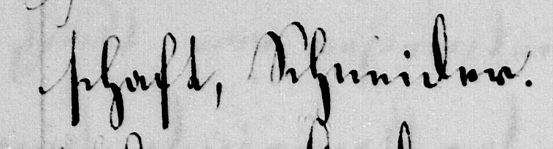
schaft, Schneider.
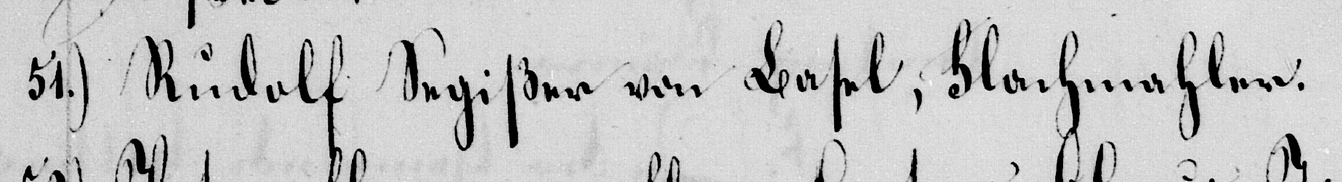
51.) Rudolf Segißer von Basel, Flachmahler.
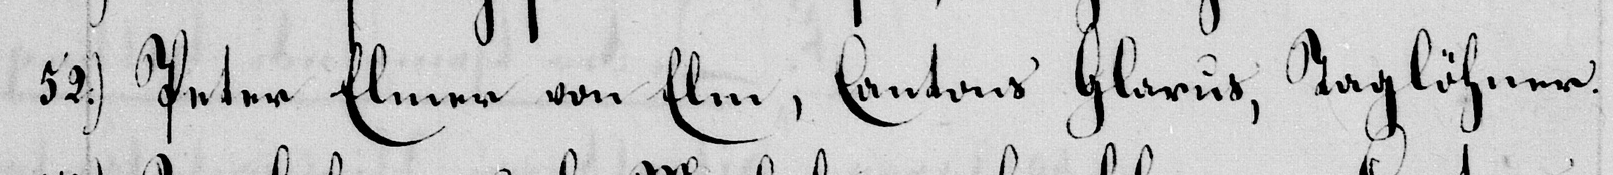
52.) Peter Elmer von Elm, Cantons Glarus, Taglöhner.
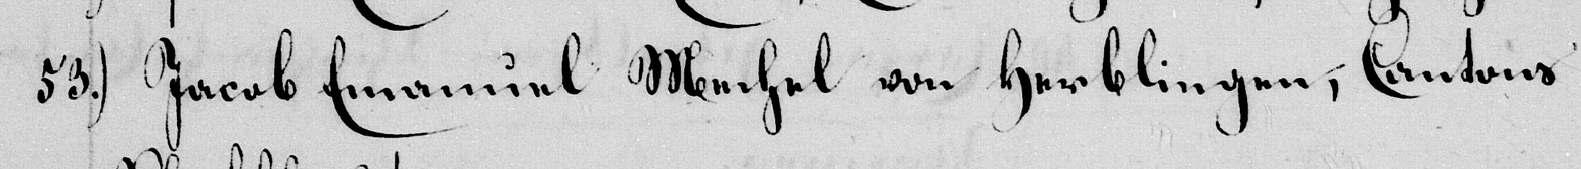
53.) Jacob Emanuel Mechel von Herblingen, Cantons
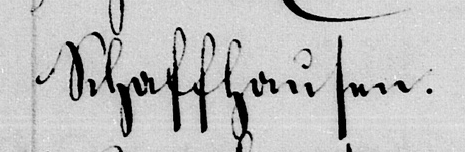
Schaffhausen.
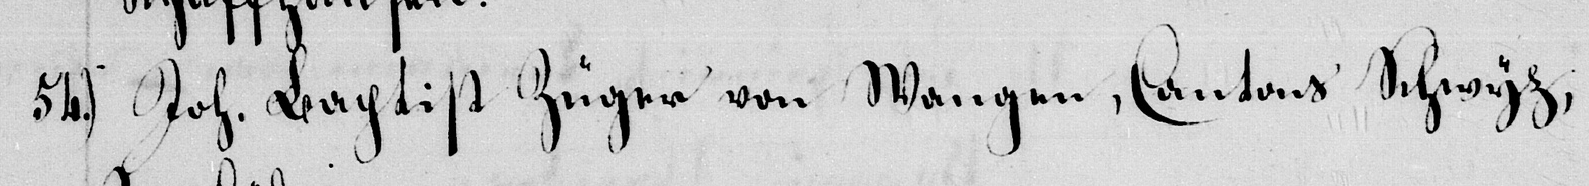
54.) Joh. Baptist Züger von Wangen, Cantons Schwyz,
